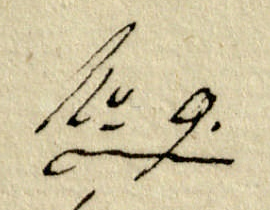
No 9.
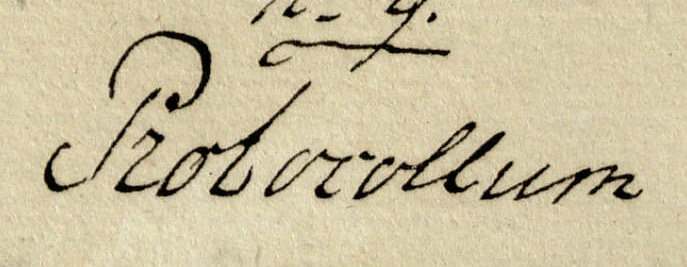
Protocollum
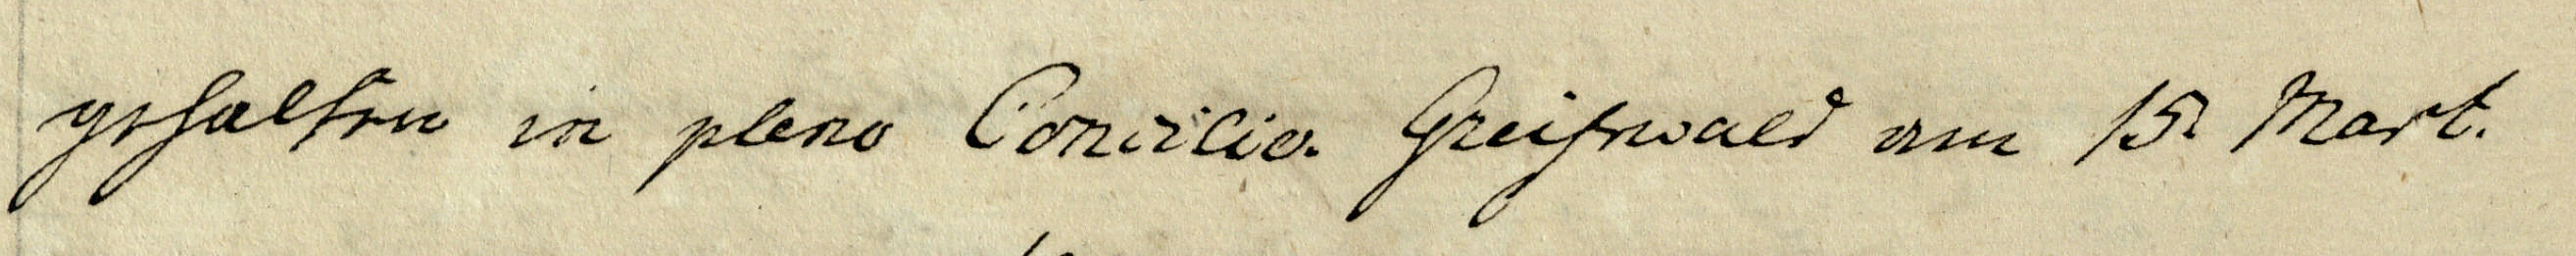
gehalten in pleno Concilio. Greifswald am 15 Mart.
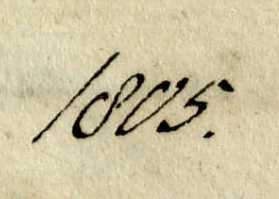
1805.
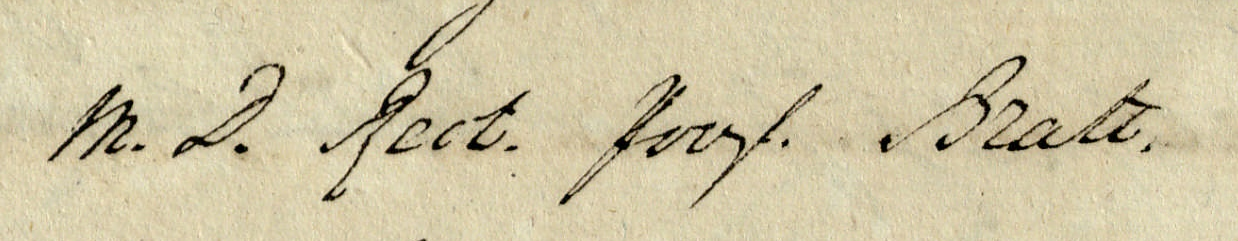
M. D. Rect. Prof. Bratt.
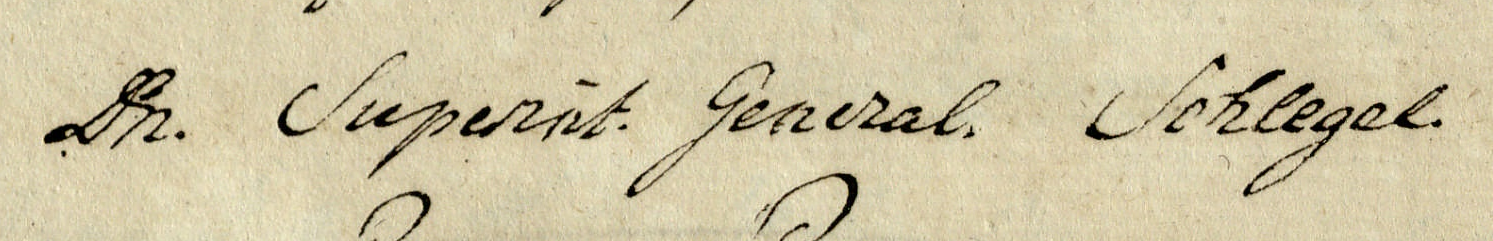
Dn. Superint. General. Schlegel.
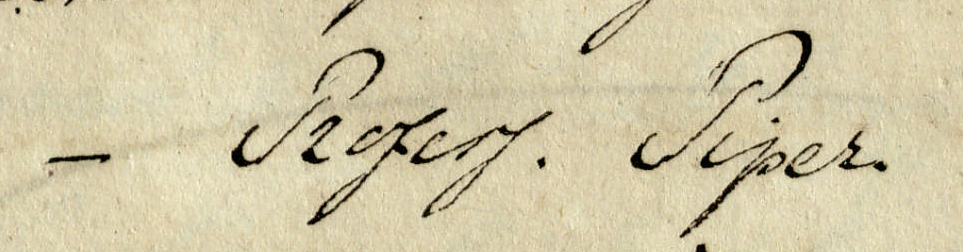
Profess. Piper.
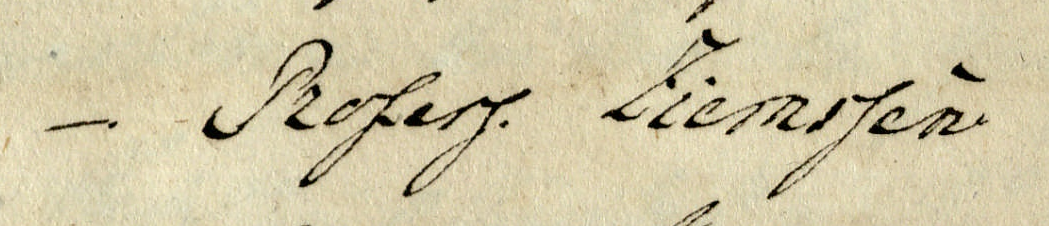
Profess. Ziemssen.
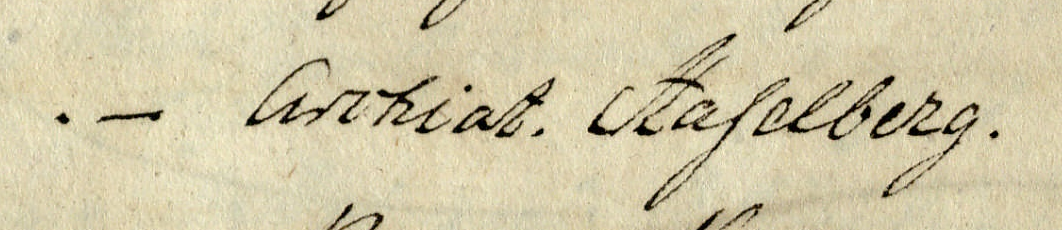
Archiat. Haselberg.
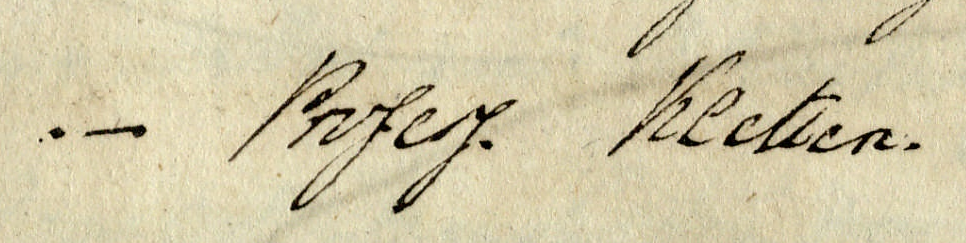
Profess. Kletten.
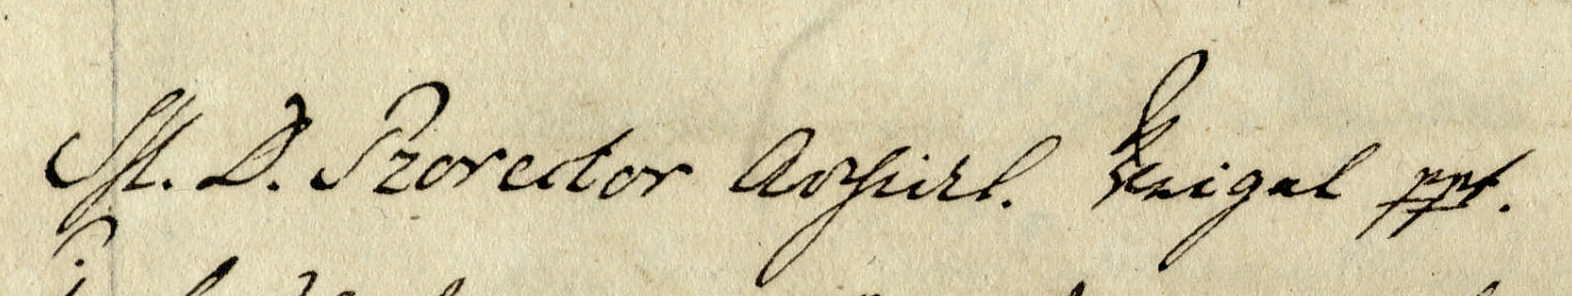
M. D. Prorector Archiat. Weigel ppt.
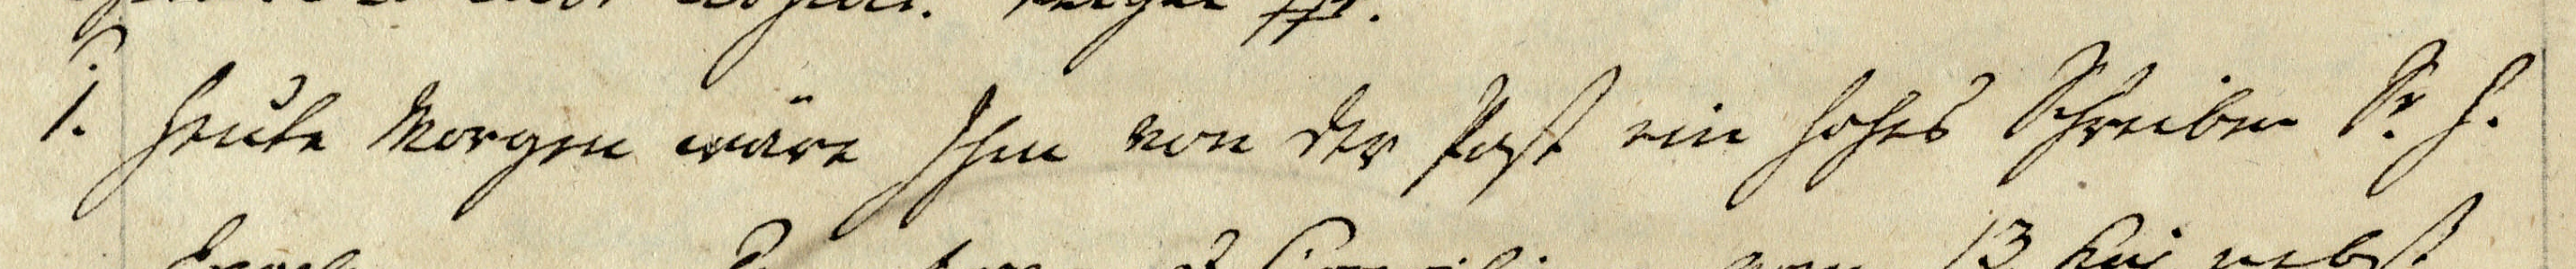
1. Heute Morgen wäre Ihm von der Post ein hohes Schreiben Sr h.
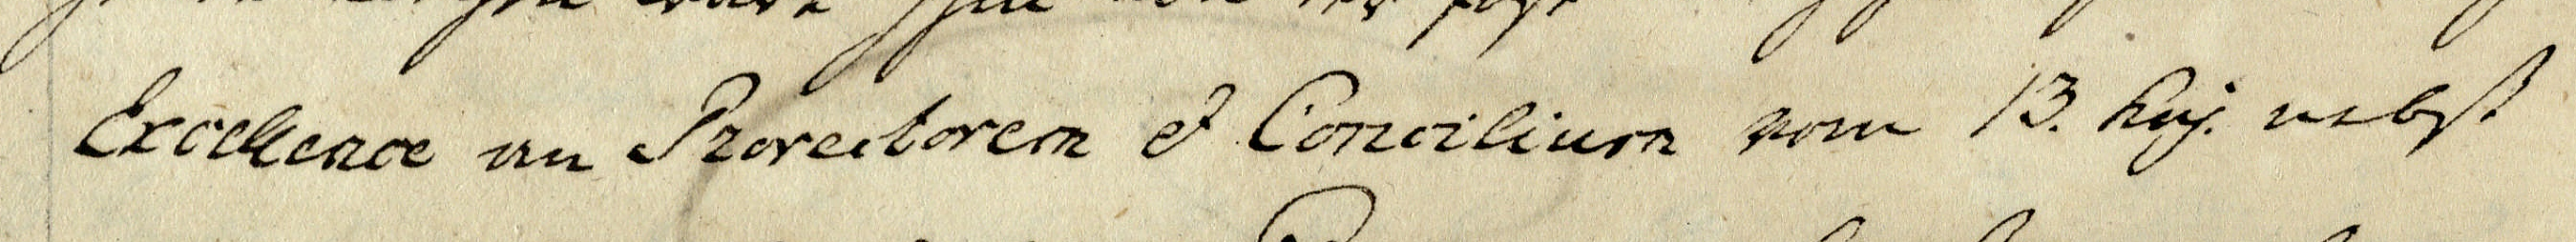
Excellence an Prorectorem et Concilium vom 13. huj. nebst
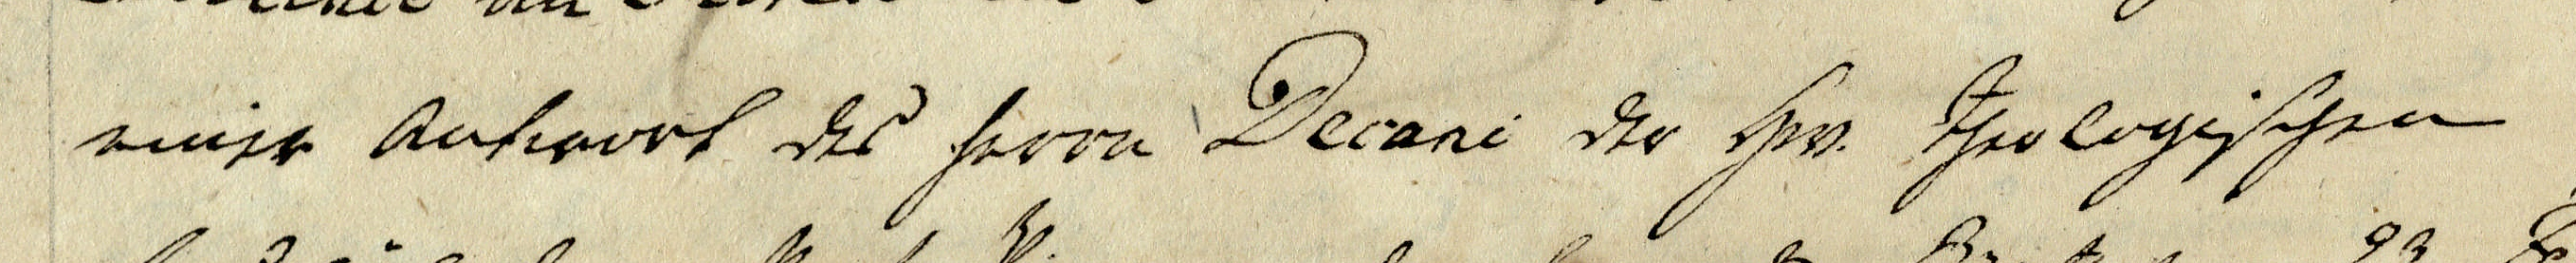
einer Antwort des Herrn Decani der Hw. Theologischen
